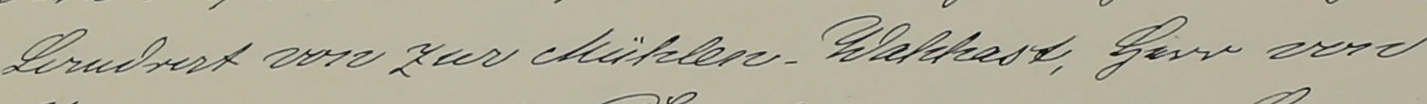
Landrat von zur Mühlen-Wahhast, Herr von
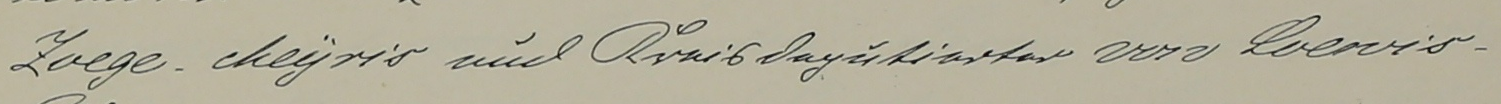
Zoege-Meyris und Kreisdeputierter von Loewis-
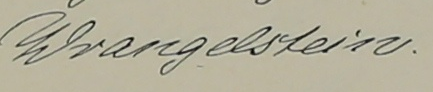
Wrangelstein.
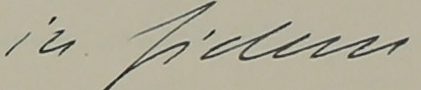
in fidem
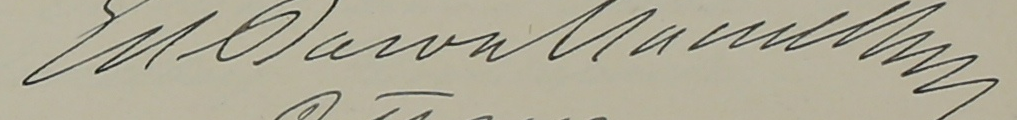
Ed Baron Stackelberg
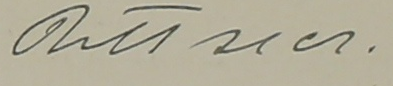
Ritt.secr.
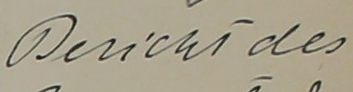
Bericht des
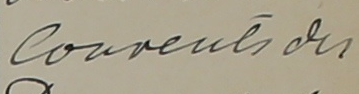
Convents der
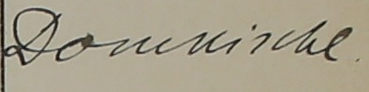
Domkirche
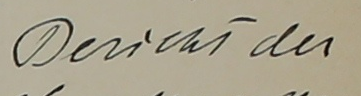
Bericht der
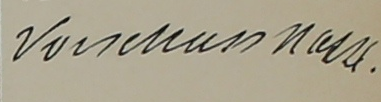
Vorschusskasse
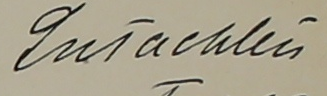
Gutachten
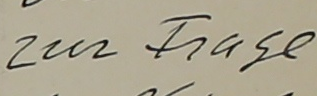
zur Frage
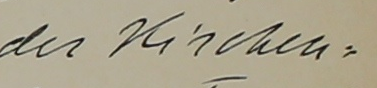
der Kirchen-
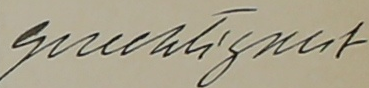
gerechtigkeit
